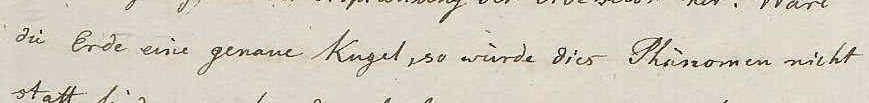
die Erde eine genaue Kugel, so würde dies Phänomen nicht
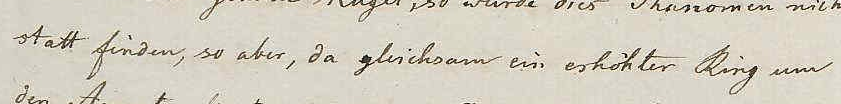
statt finden, so aber, da gleichsam ein erhöhter Ring um
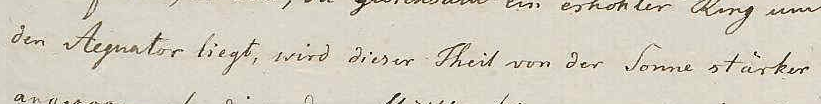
den Aequator liegt, wird dieser Theil von der Sonne stärker
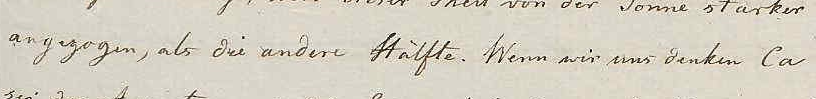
angezogen, als die andere Hälfte. Wenn wir uns denken Ca
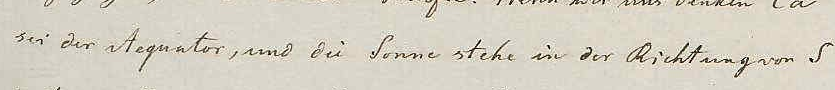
sei der Aequator, und die Sonne stehe in der Richtung von S
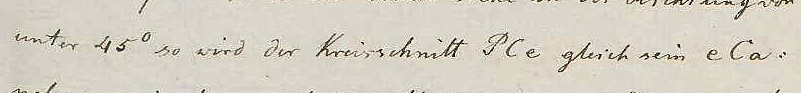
unter 45° so wird der Kreisschnitt PCe gleich sein eCa:
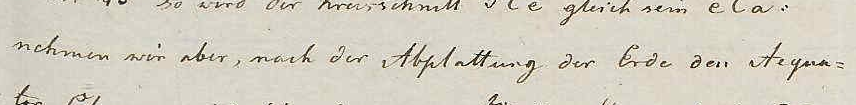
nehmen wir aber, nach der Abplattung der Erde den Aequa-
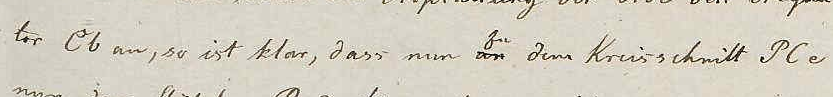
tor Cb an, so ist klar, dass nun anzu dem Kreisschnitt PCe
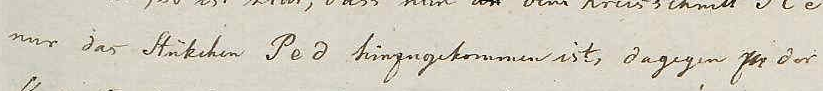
nur das Stükchen Ped hinzugekommen ist, dagegen zu der
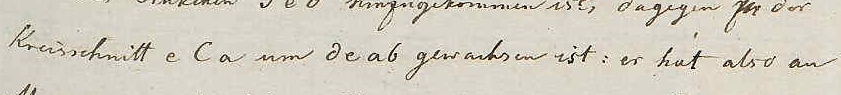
Kreisschnitt eCa um deab gewachsen ist: er hat also an
